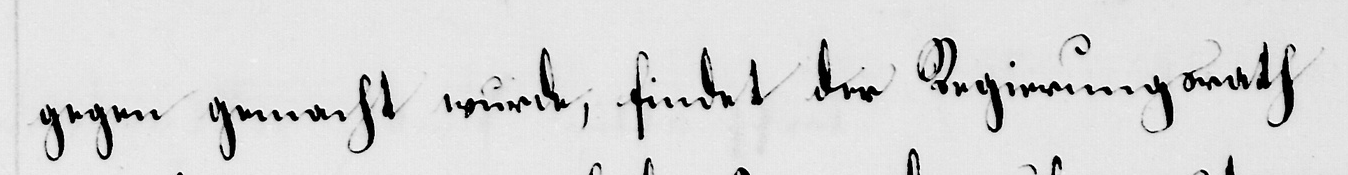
gegen gemacht wurde, findet der Regierungsrath
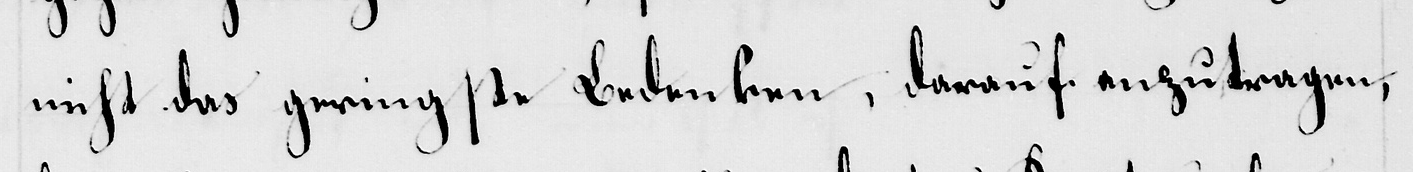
nicht das geringste Bedenken, darauf anzutragen,
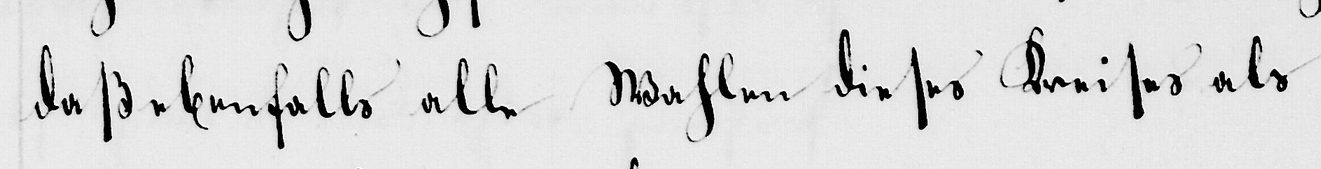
daß ebenfalls alle Wahlen dieses Kreises als
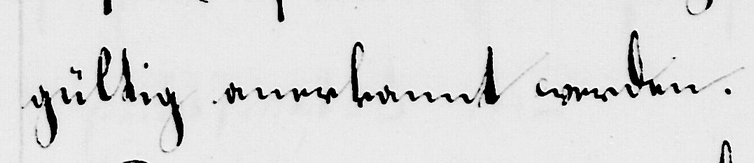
gültig anerkannt werden.
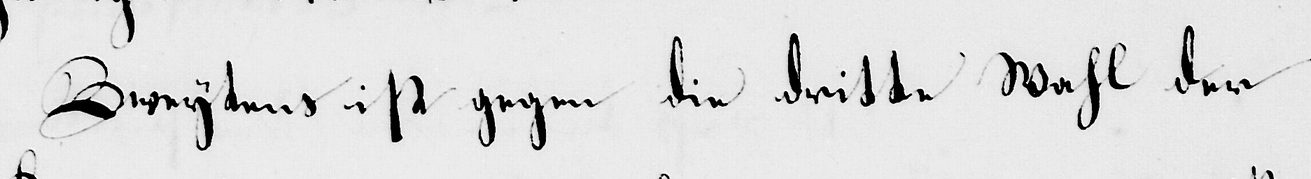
Zweytens ist gegen die dritte Wahl der
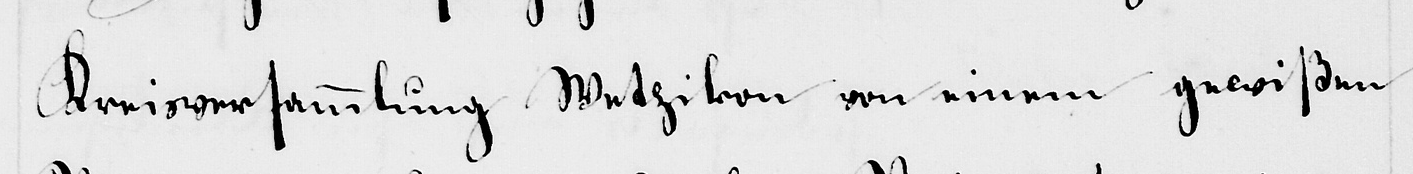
Kreisversammlung Wetzikon von einem gewißen
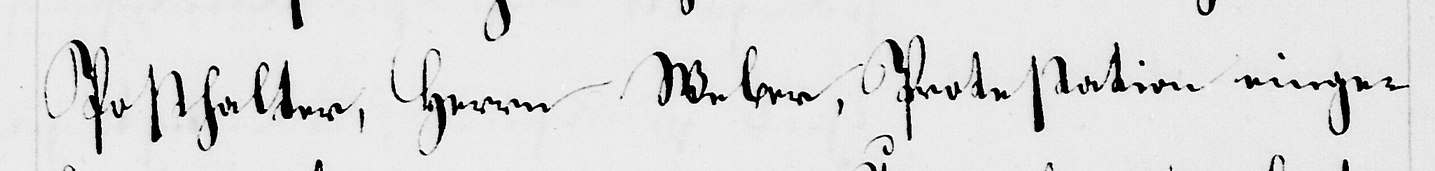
Posthalter, Herrn Weber, Protestation einge¬
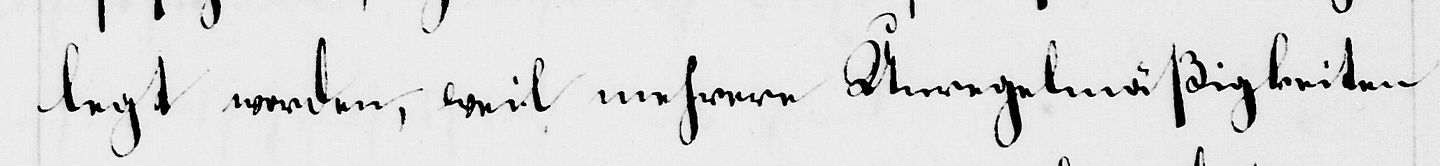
legt worden, weil mehrere Unregelmäßigkeiten
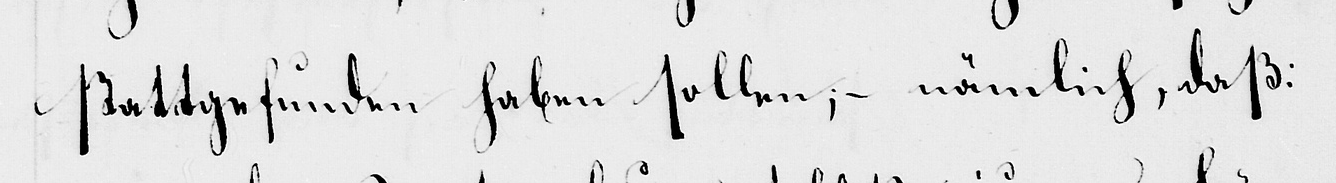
stattgefunden haben sollen; – nämlich, daß:
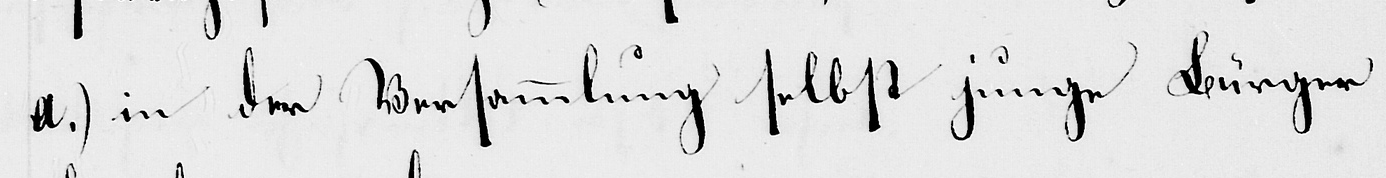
a.) in der Versammlung selbst junge Bürger
